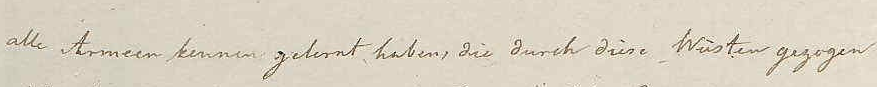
alle Armeen kennen gelernt haben, die durch diese Wüsten gezogen
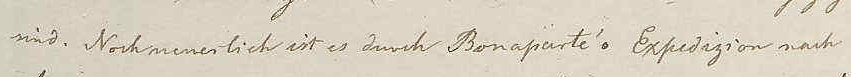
sind. Noch neuerlich ist es durch Bonaparte's Expedizion nach
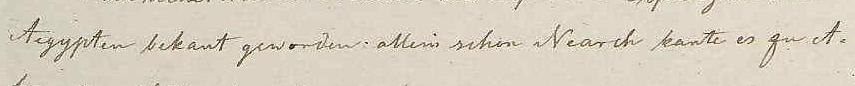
Aegypten bekant geworden: allein schon Nearch kante es zu A-
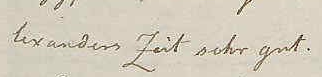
lexanders Zeit sehr gut.
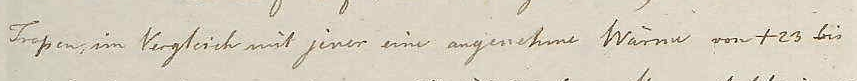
Tropen, im Vergleich mit jener eine angenehme Wärme von +23 bis
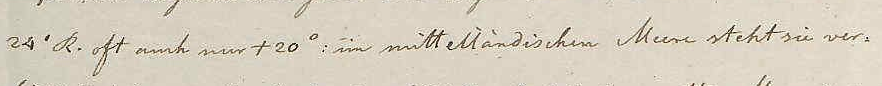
24° R. oft auch nur +20°: im mittelländischen Meere steht sie ver-
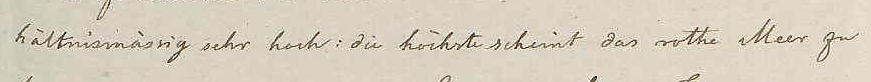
hältnismässig sehr hoch: die höchste scheint das rothe Meer zu
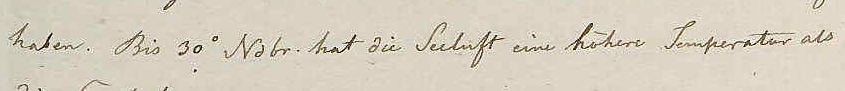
haben. Bis 30° Ndbr. hat die Seeluft eine höhere Temperatur als
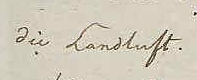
die Landluft.
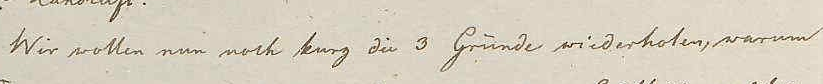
Wir wollen nun noch kurz die 3 Gründe wiederholen, warum
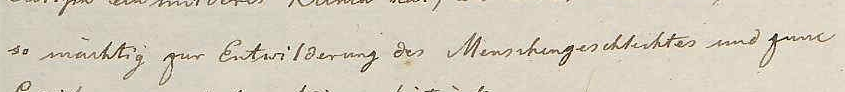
so mächtig zur Entwilderung des Menschengeschlechtes und zum
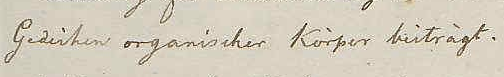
Gedeihen organischer Körper beiträgt.
